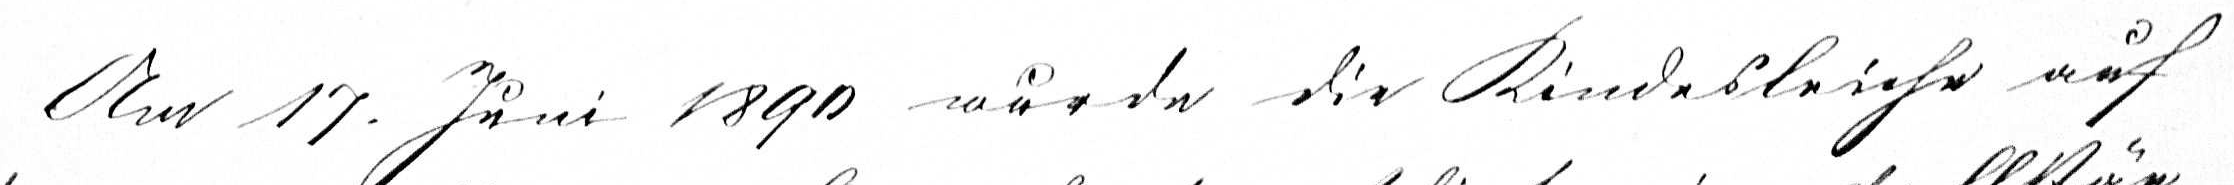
Am 17. Juni 1890 wurde die Kindesleiche auf
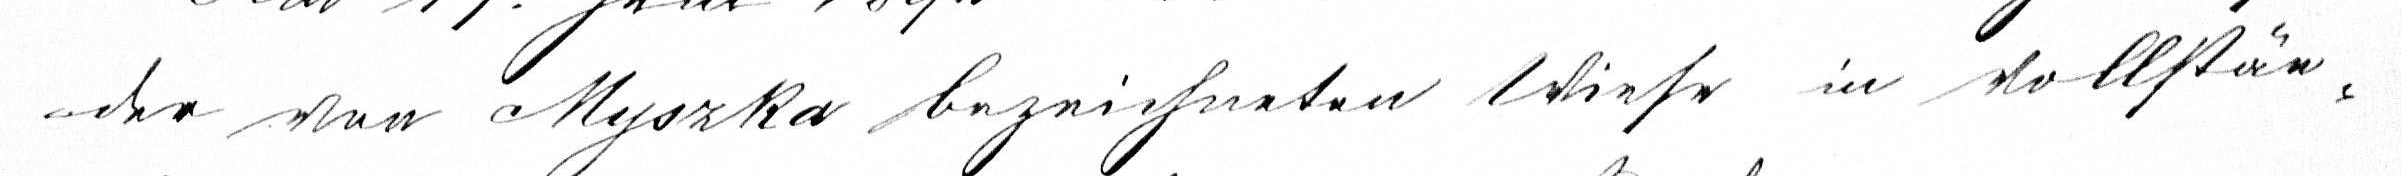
der von Myszka bezeichneten Wiese in vollstän¬
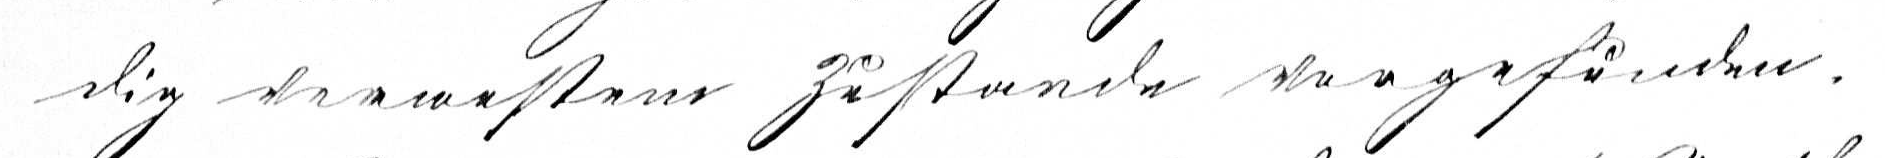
dig verwestene Zustande vorgefunden.
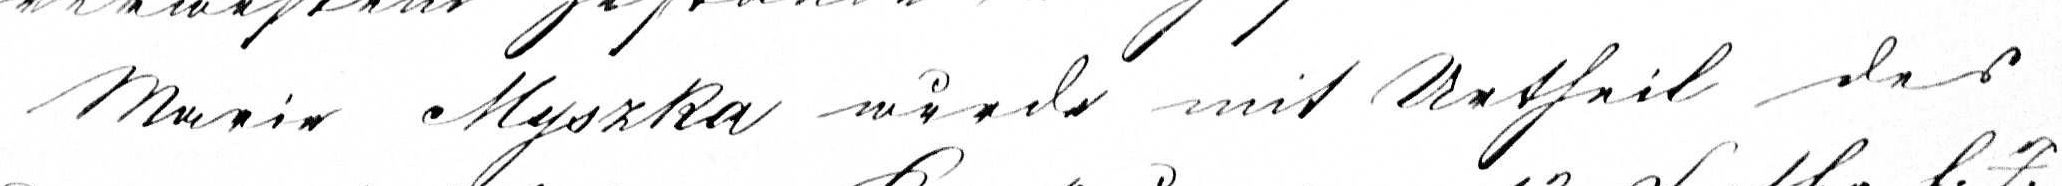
Marie Myszka wurde mit Urtheil des
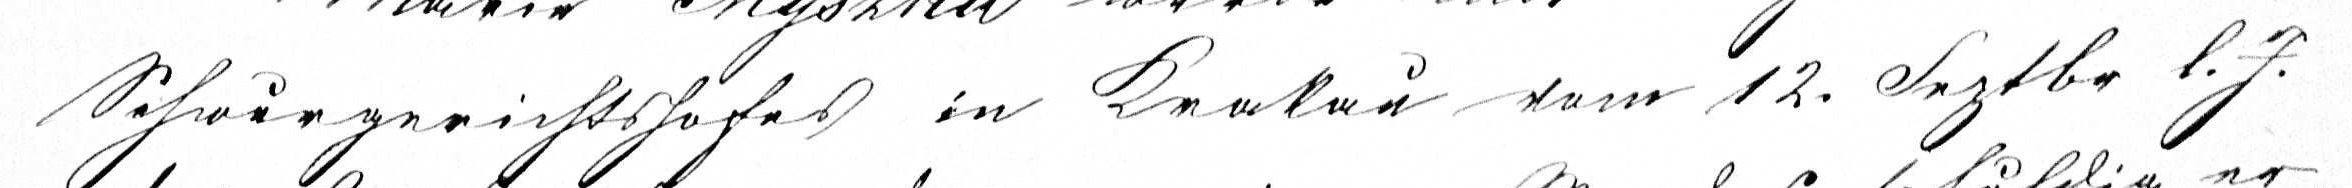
Schourgerichtshofes in Krakau vom 12. Septbr l. J.
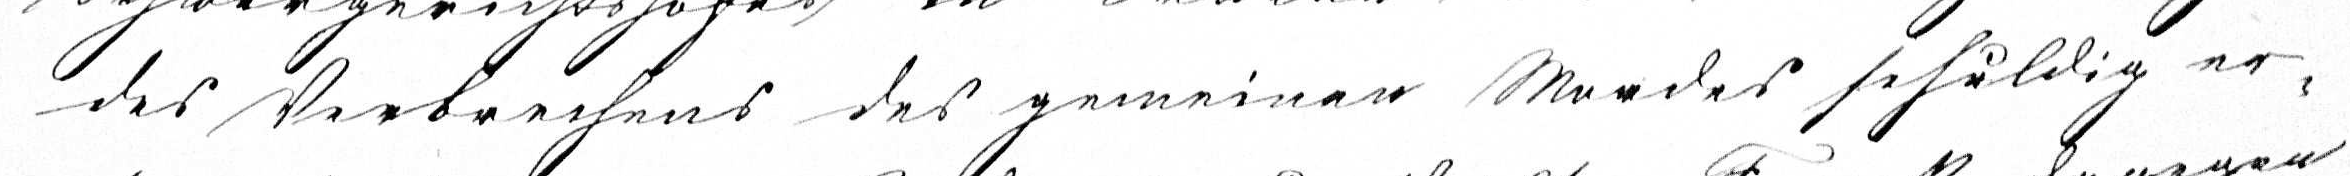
des Verbrechens des gemeinen Mordes schuldig er¬
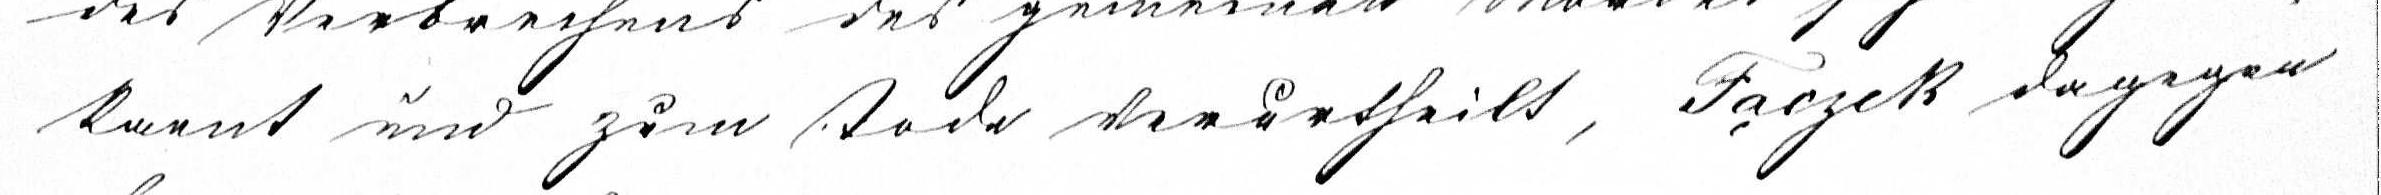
kxx und zum Tode verurtheilt, Fączek dagegen
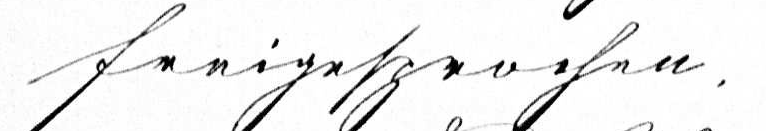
Freigesprochen.
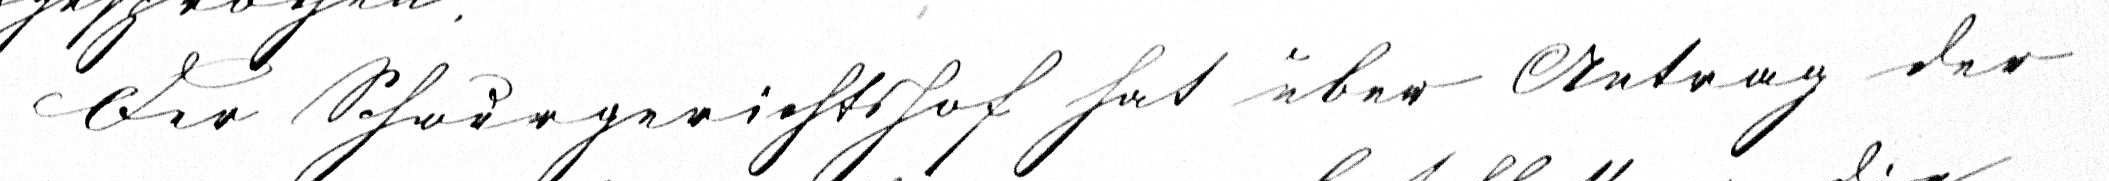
Der Schwurgerichtshof hat über Antrag der
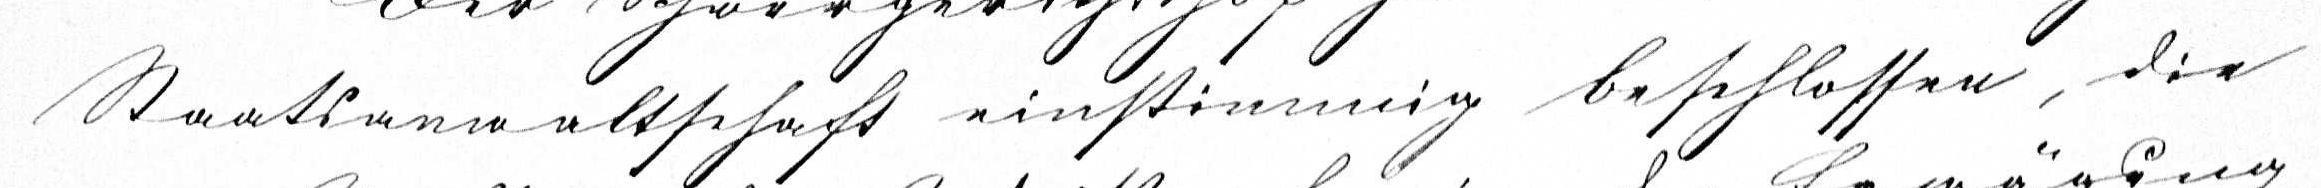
Staatsanwaltschaft einstimmig beschlossen, die
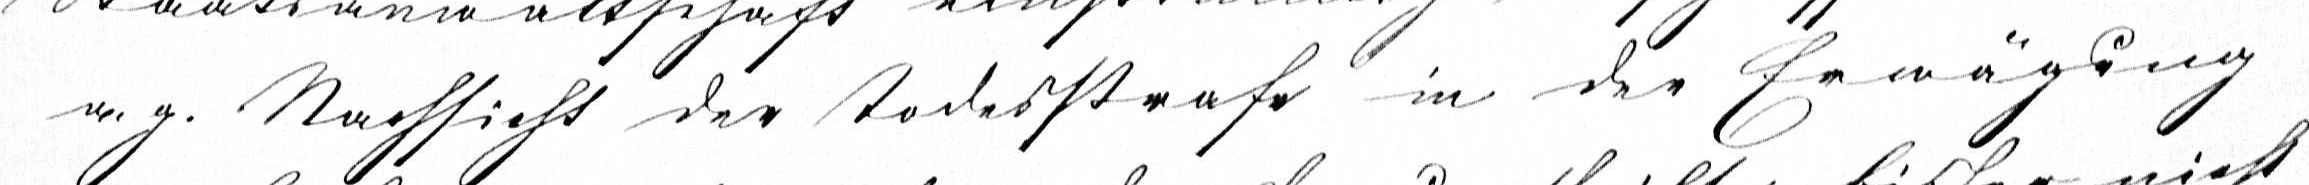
a. g.Nach sicht der Todesstrafe in der Erwägung
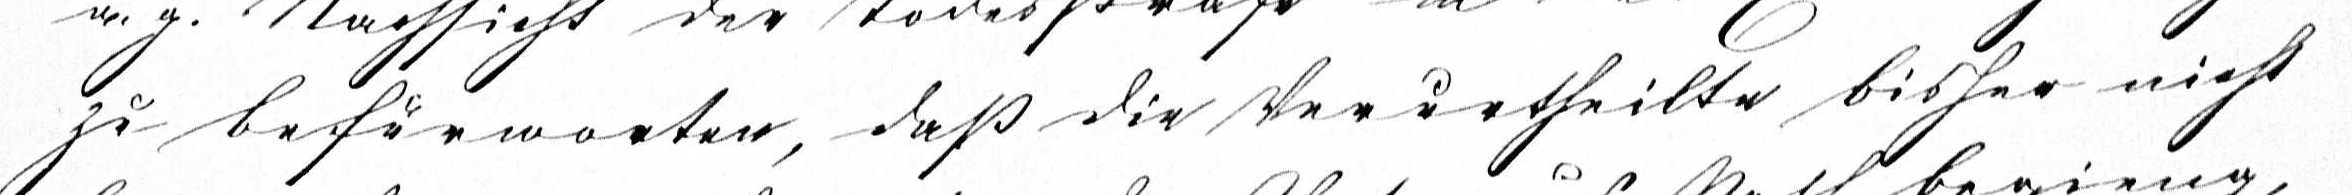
zu befürworten, daß die Verurtheilte bisher nicht
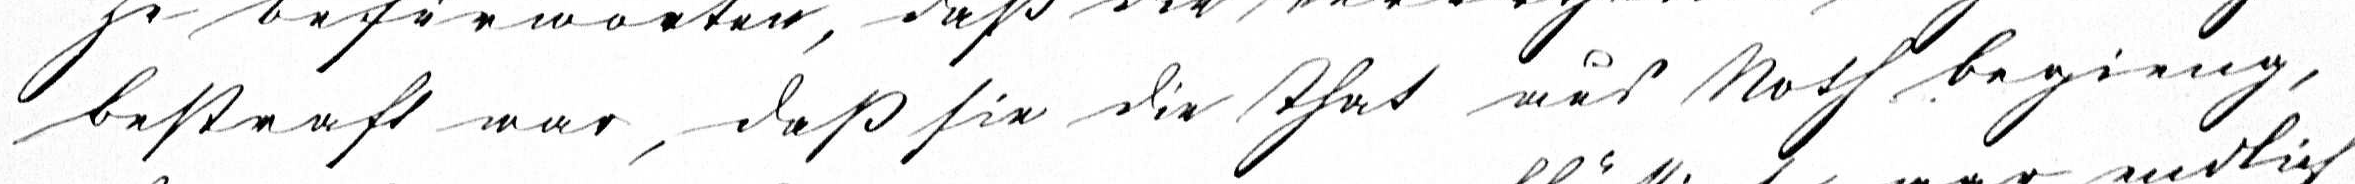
bestraft war, daß sie die That aus Noth begieng,
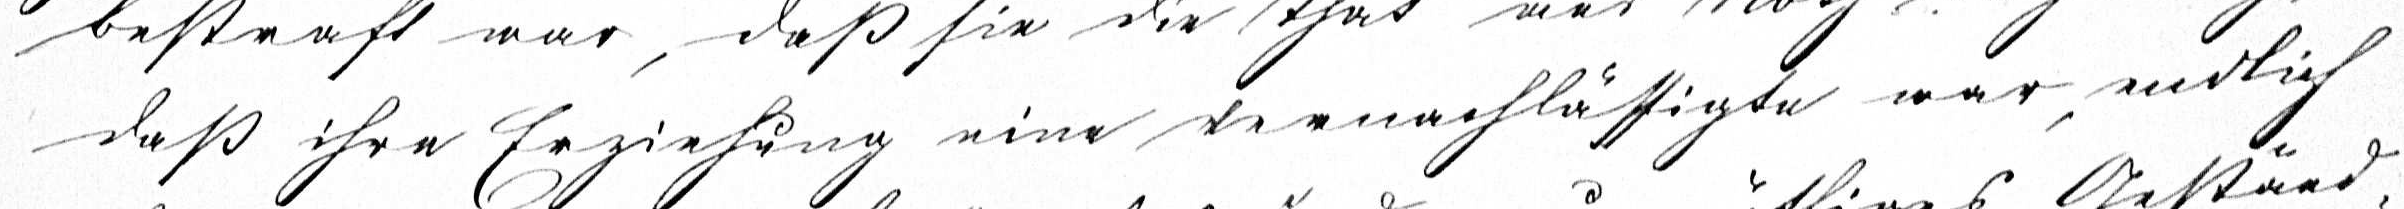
daß ihre Erziehung eine vernachlässigte war, endlich
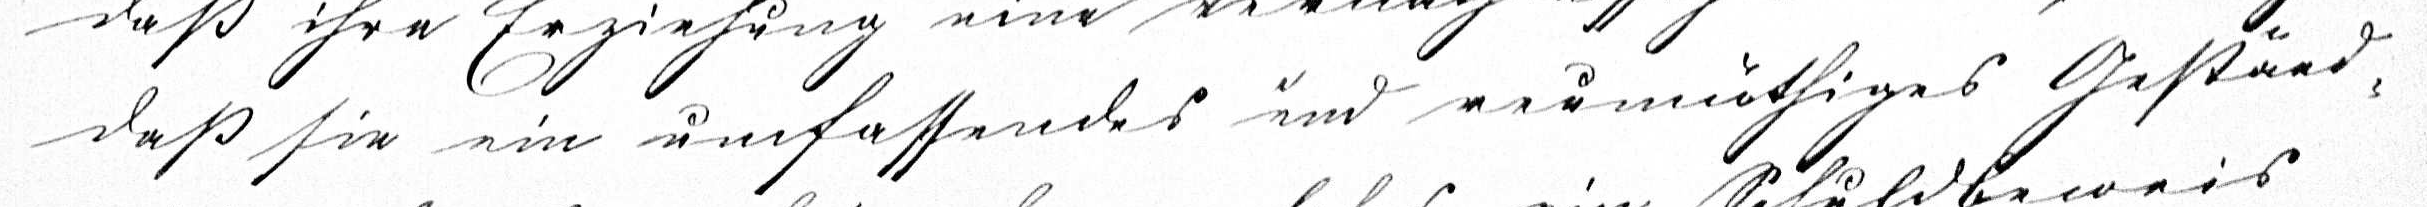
daß sie ein umfassendes und reumüthiges Geständ¬
